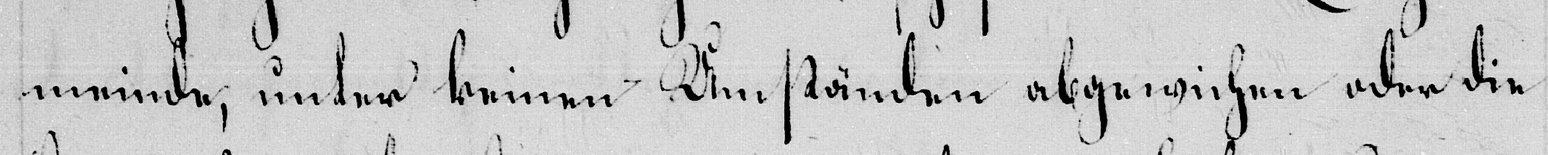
meinde, unter keinen Umständen abgewichen oder die
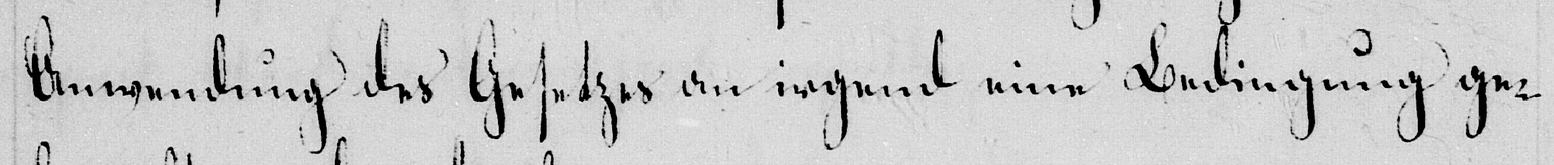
Anwendung des Gesetzes an irgend eine Bedingung ge¬
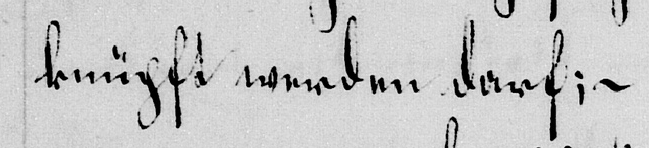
knüpft werden darf, –
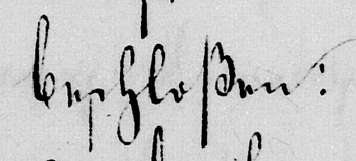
beschloßen:
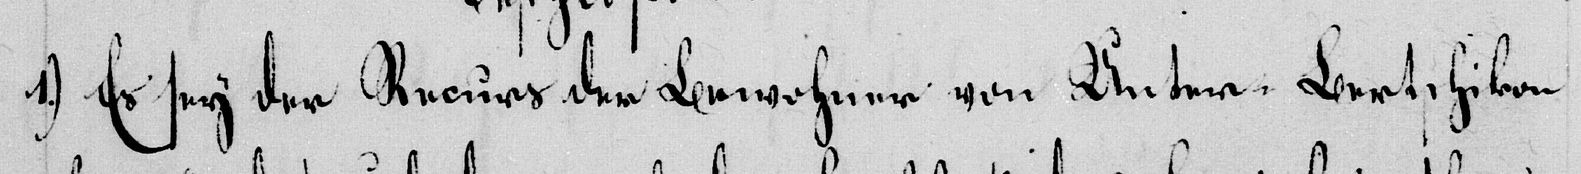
1.) Es sey der Recurs der Bewohner von Unter-Bertschikon
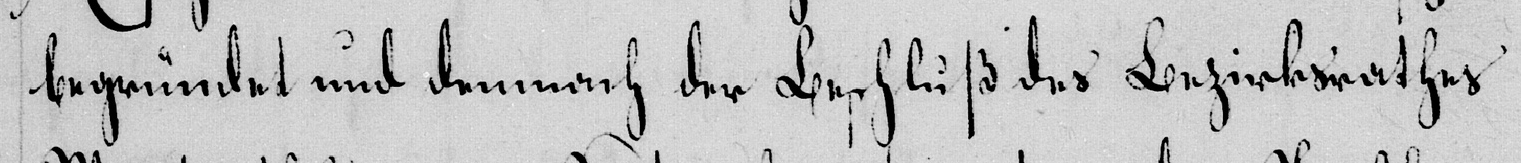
begründet und demnach der Beschluß des Bezirksrathes
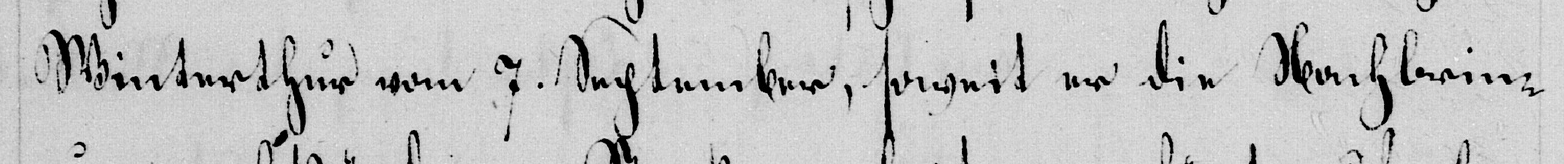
Winterthur vom 7. September, soweit er die Nachbrin¬
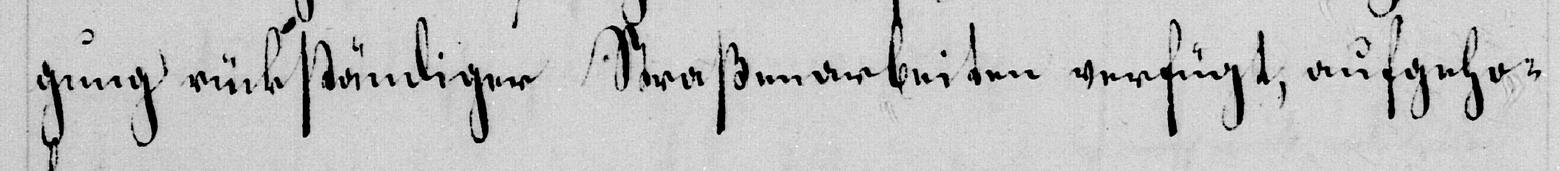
gung rückständiger Straßenarbeiten verfügt, aufgeho¬
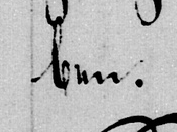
ben.
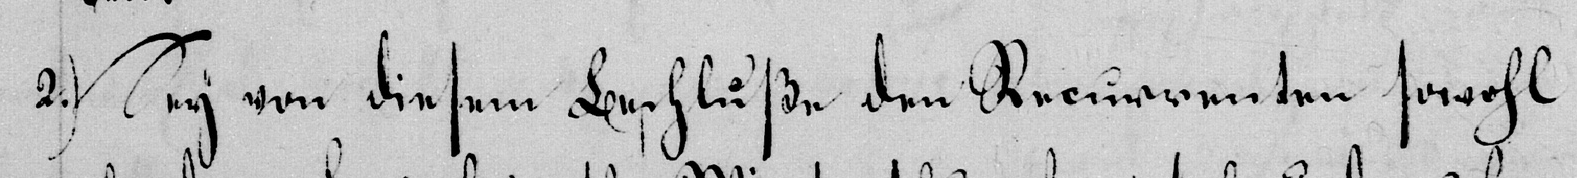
2.) Sey von diesem Beschluße den Recurrenten sowohl
